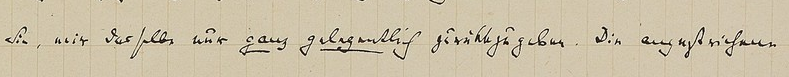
Sie, mir dasselbe nur ganzgelegentlich zurükkzugeben. Die angestrichene
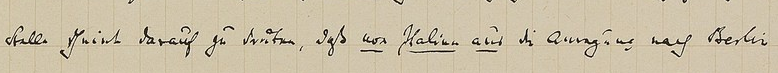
Stelle scheint darauf zu deuten, daß vonItalienaus die Anregung nach Berlin
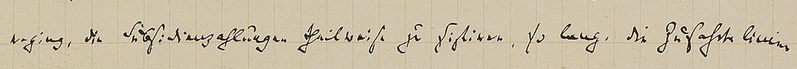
erging, die Subsidienzahlungen theilweise zu sistiren, so lange die Zufahrtslinien
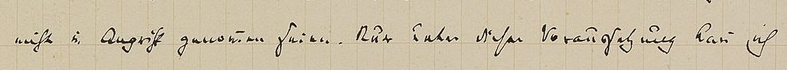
nicht in Angriff genommen seien. Nur unter dieser Voraussetzung kann ich
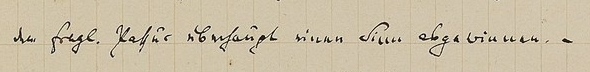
dem fragl. Passus überhaupt einen Sinn abgewinnen. –
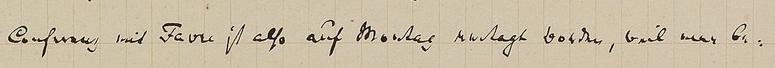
Conferenz mit Favre ist also auf Montag vertagt worden, weil man be-
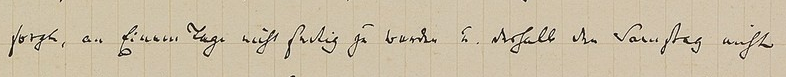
sorgte, an Einem Tage nicht fertig zu werden u. deshalb den Samstag nicht
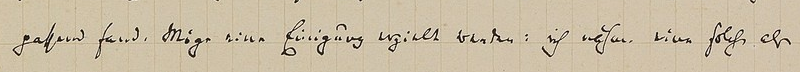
passend fand. Möge eine Einigung erzielt werden: ich nähme eine solche als
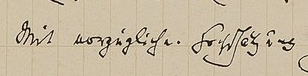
Mit vorzüglicher Hochschätzung
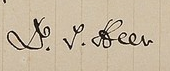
Dr J. Heer
